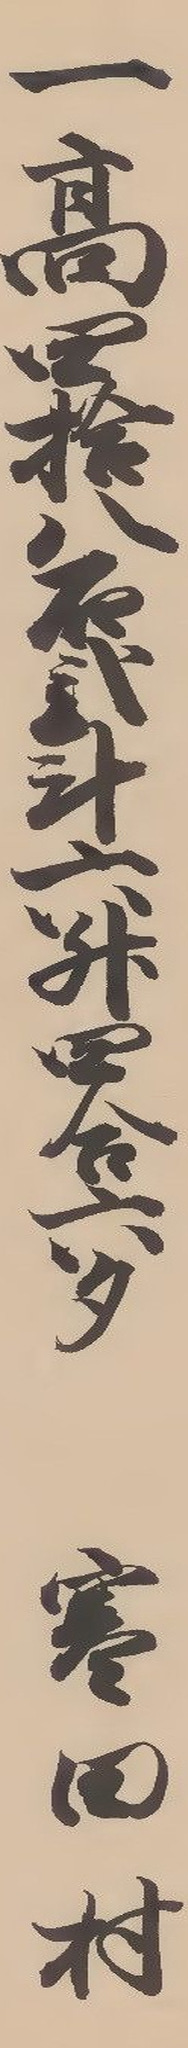一高四拾八石弐斗六升四合六勺寒田村
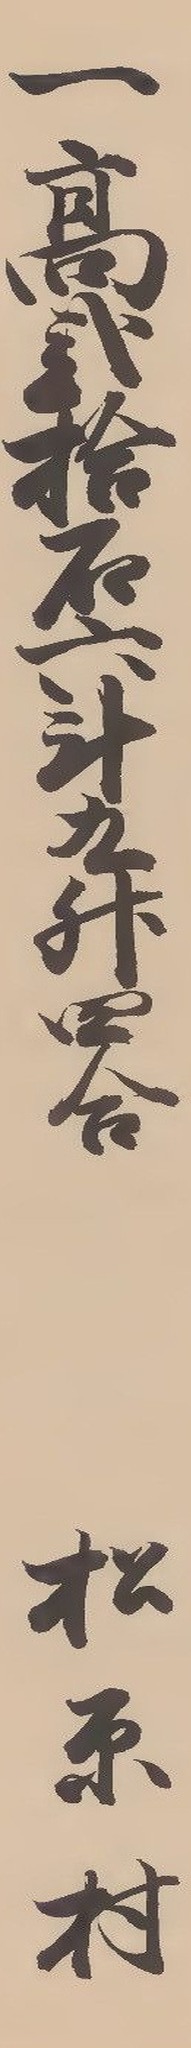一高弐拾石六斗九升四合松原村
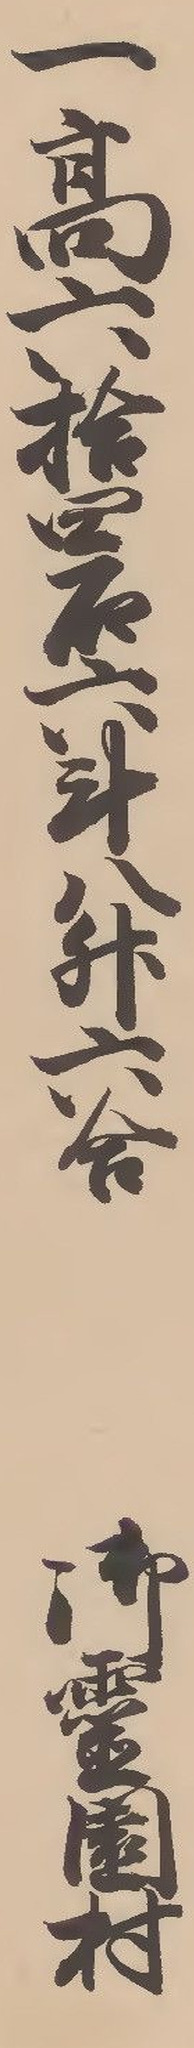一高六拾四石六斗八升六合御霊園村

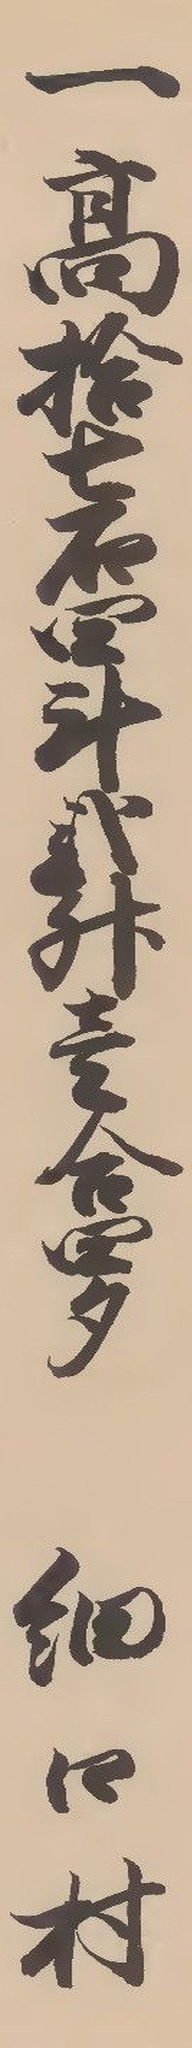一高拾七石四斗弐升壱合四勺細口村
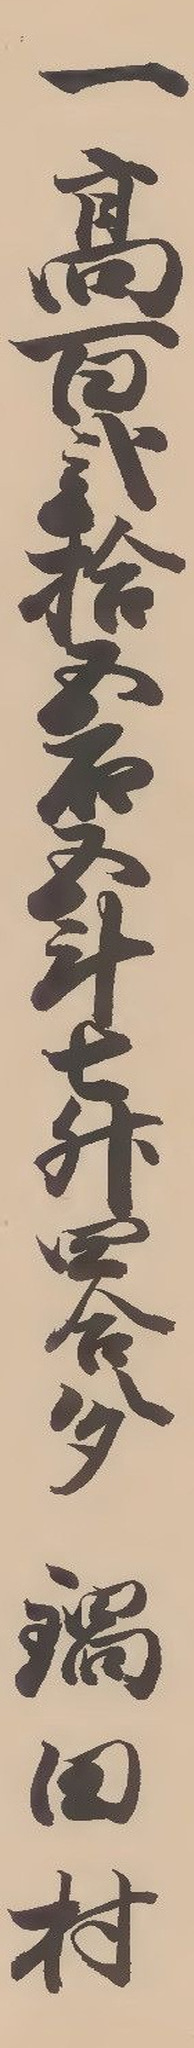一高百弐拾五石五斗七升四合八勺鍋田村
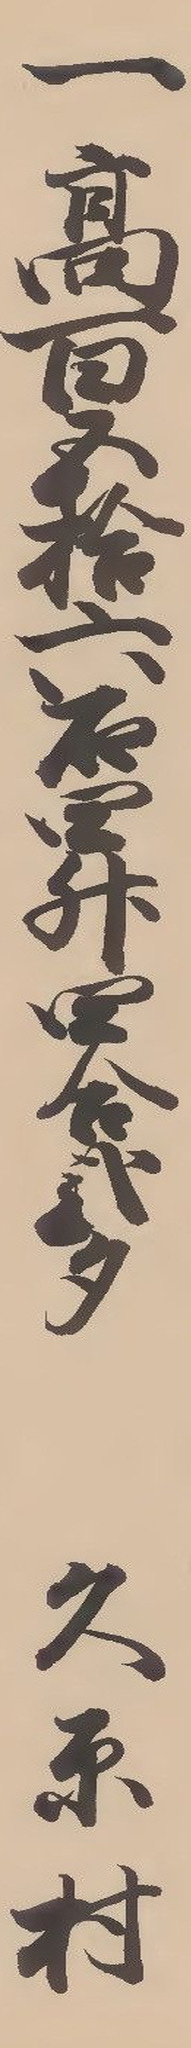一高百五拾六石四升四合弐勺久原村
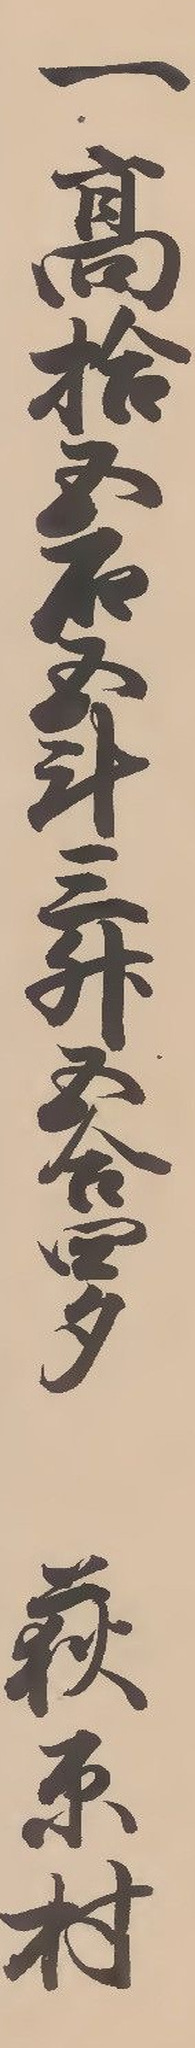一高拾五石五斗三升五合四勺萩原村
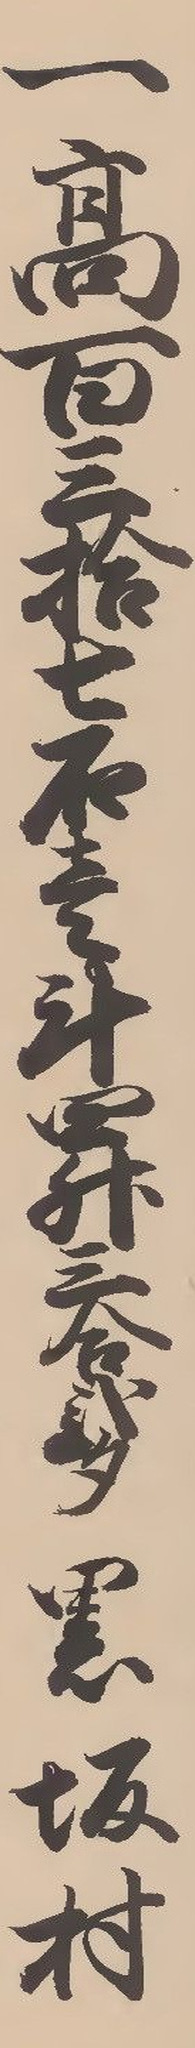一高百三拾七石壱斗四升三合弐勺黒坂村
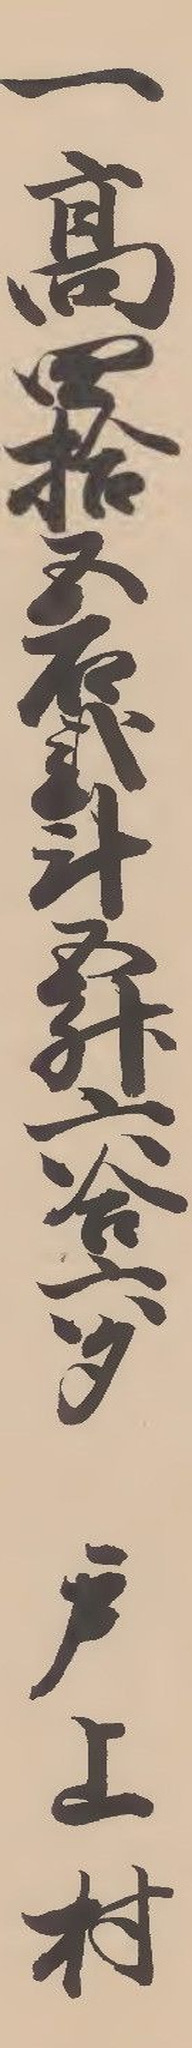一高四拾五石弐斗五升六合六勺戸上村
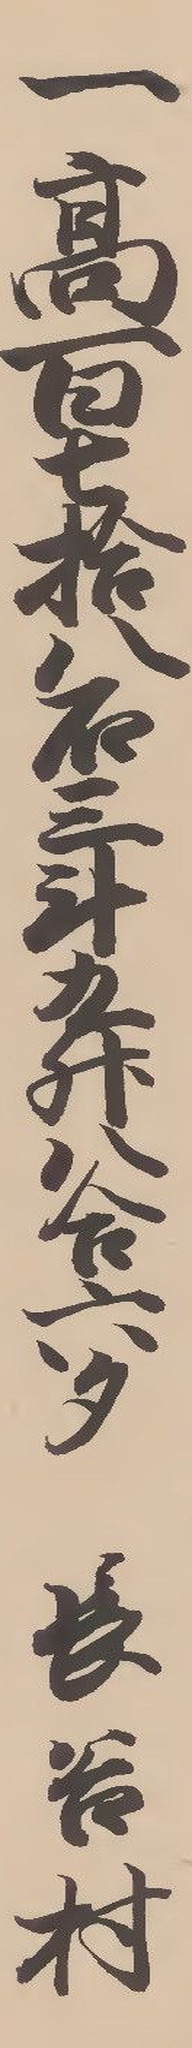一高百七拾八石三斗九升八合六勺長谷村
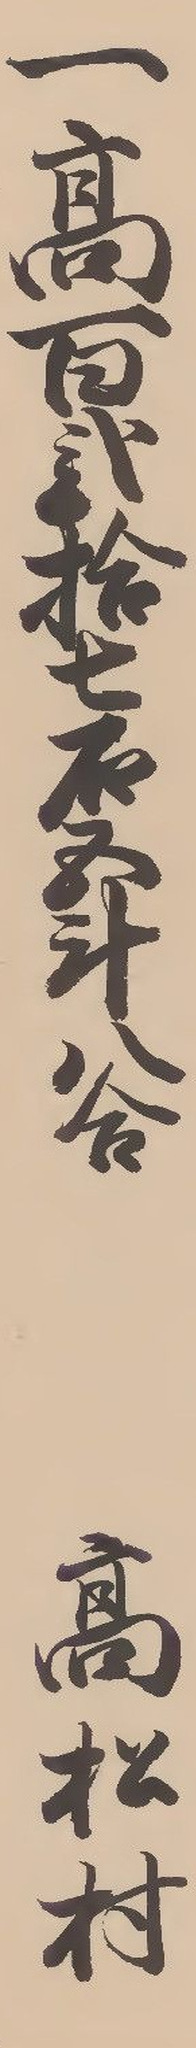一高百弐拾七石五斗八合高松村

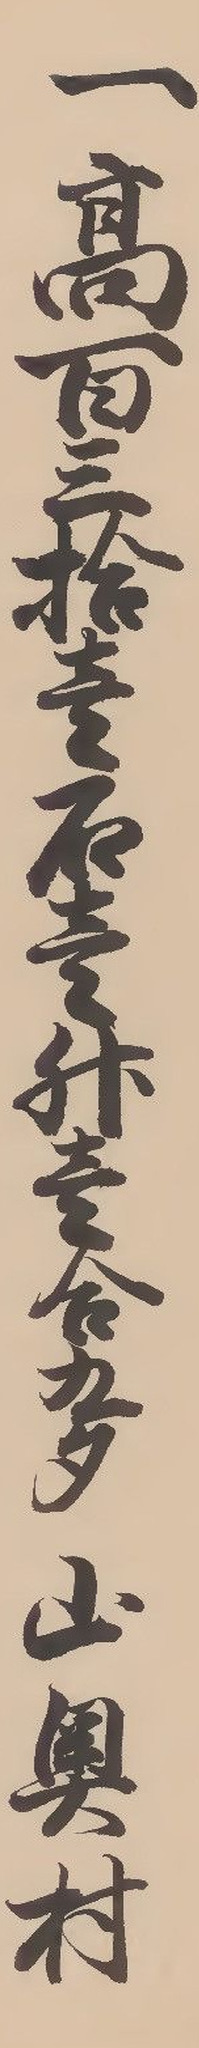一高百三拾壱石壱升壱合九勺山奥村
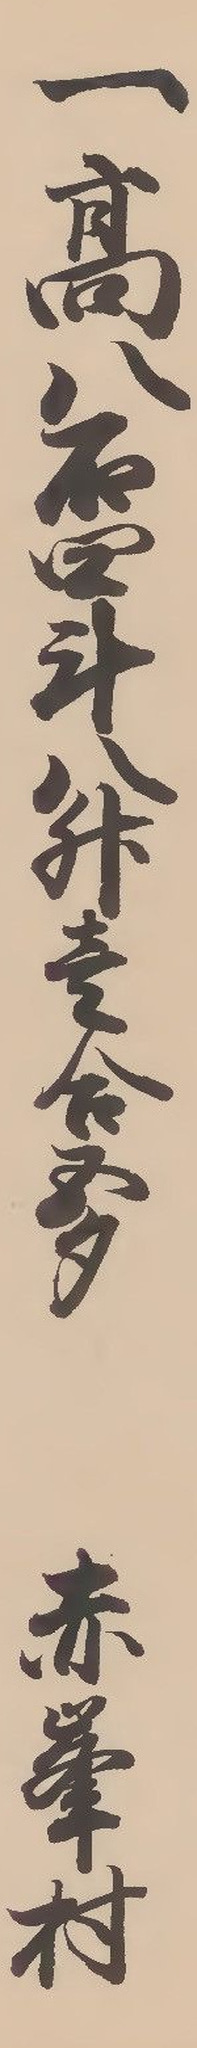一高八石四斗八升壱合五勺赤峰村
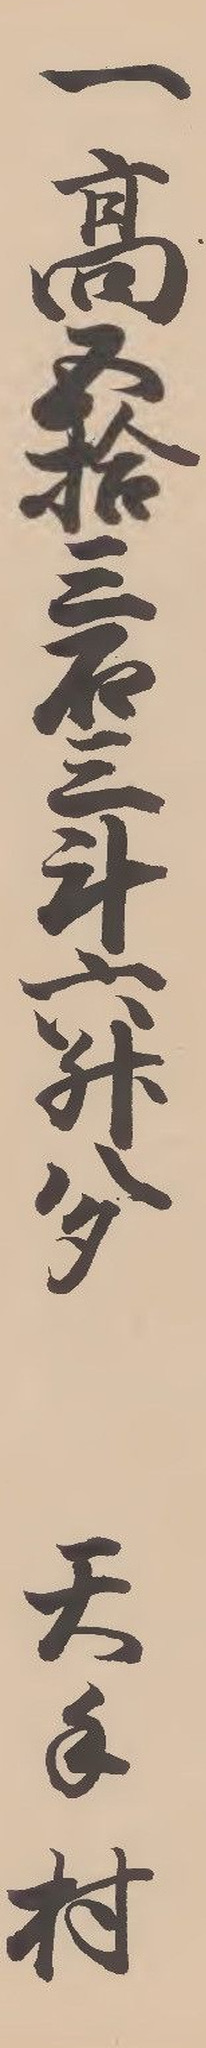一高五拾三石三斗六升八勺天手村
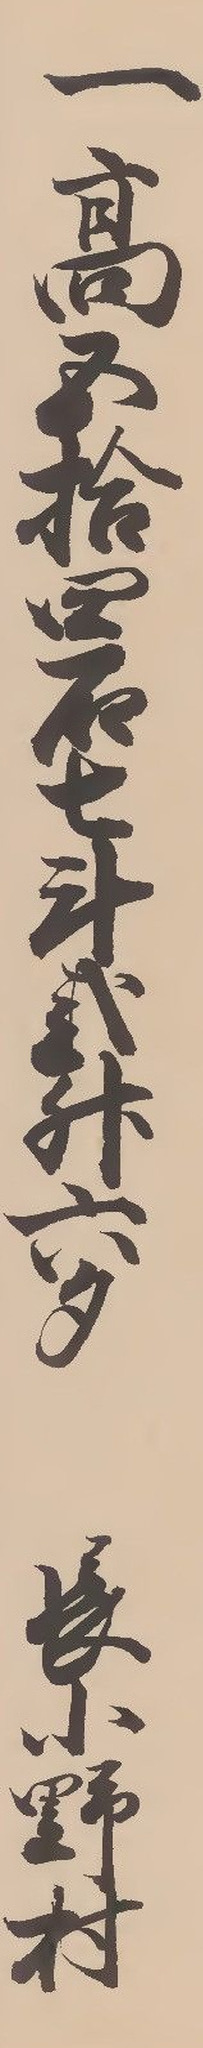一高五拾四石七斗弐升六勺長小野村
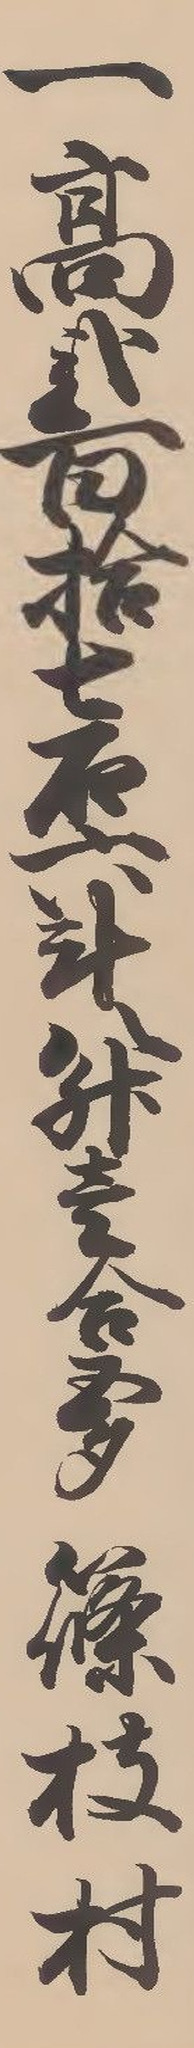一高弐百拾七石六斗八升壱合五勺篠枝村
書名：豊後国郷帳
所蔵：国立公文書館 National Archives of Japan
